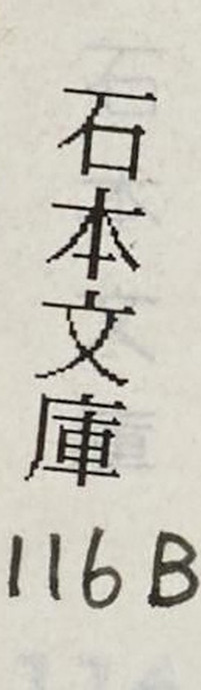石本文庫
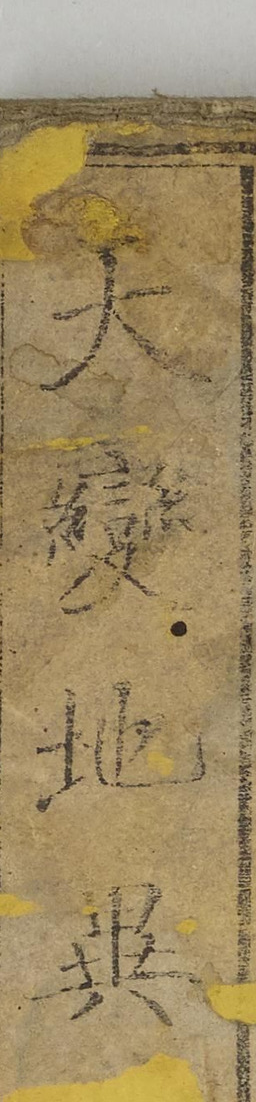天変地異

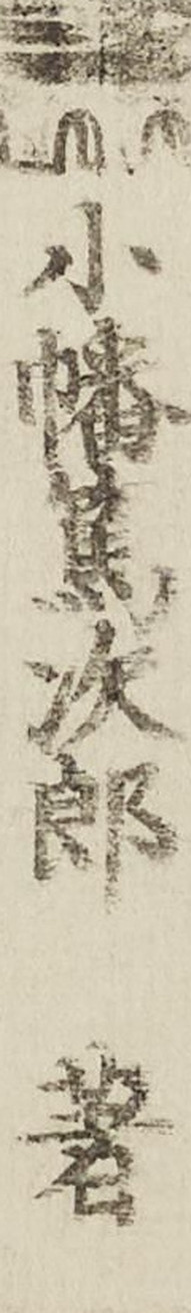小幡篤次郎著
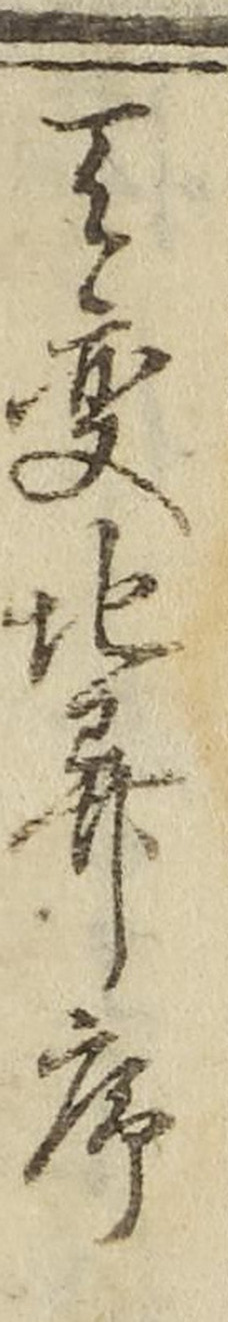天変地異序
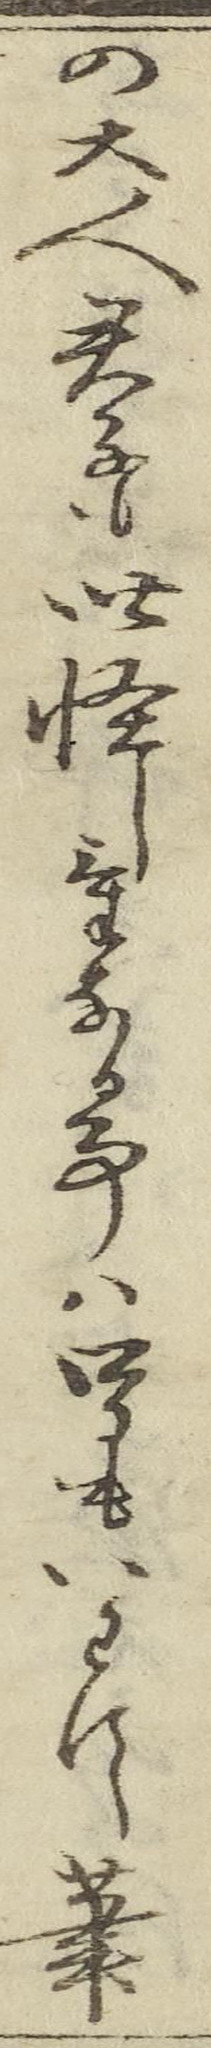の大人君子も此怪しけなる事は口にもいわす筆
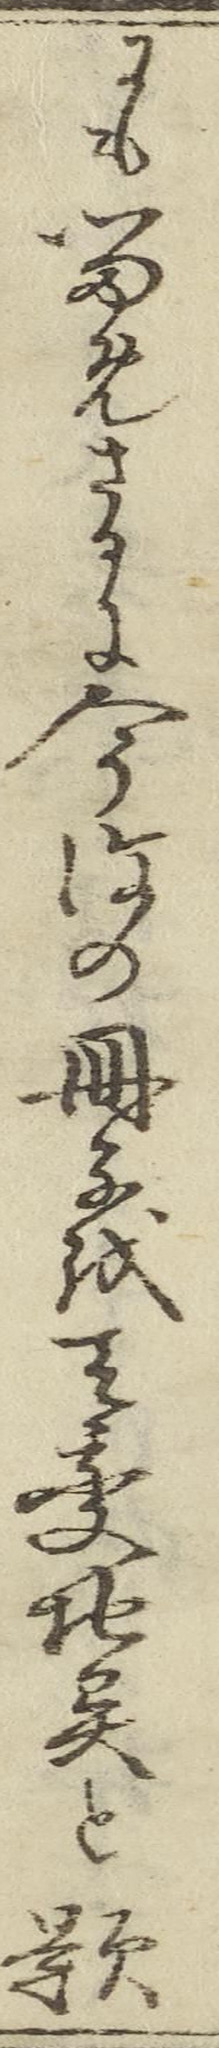にも留めさるに今この冊子を天変地異と題
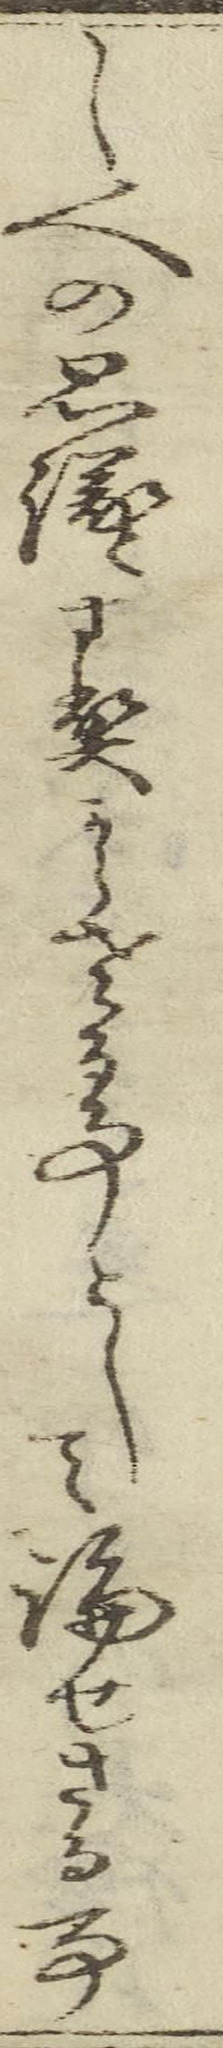し人の思議へすへからさる事として論せさる事
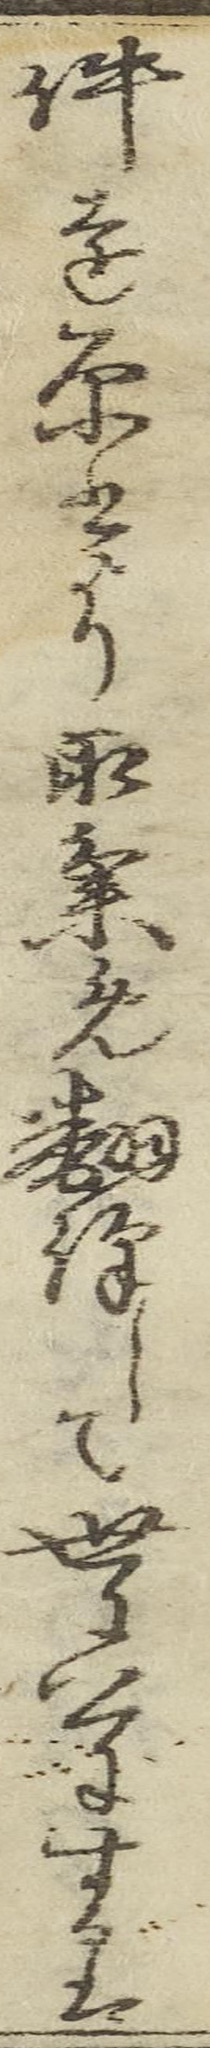件を原書より取集め翻訳して世に公にするは
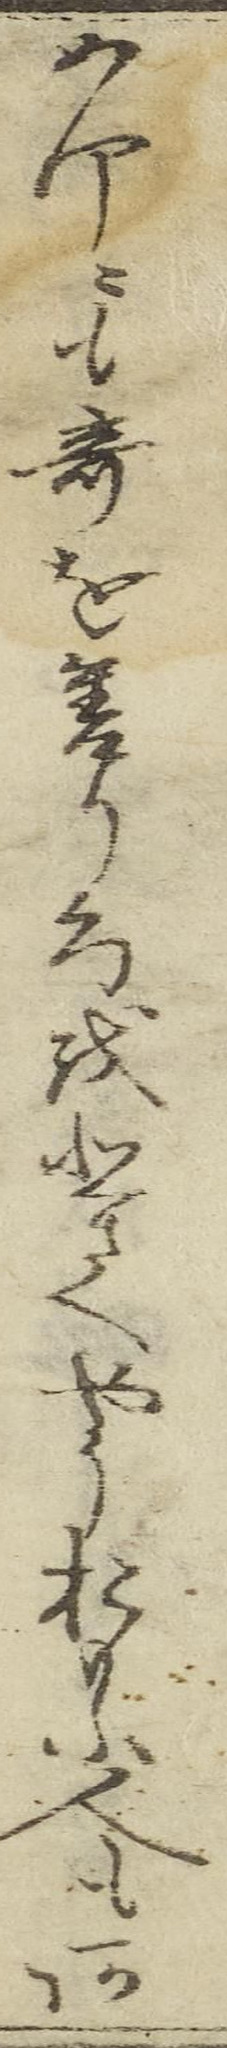如何にも奇を售り幻をひさくやうおもふ人もあ
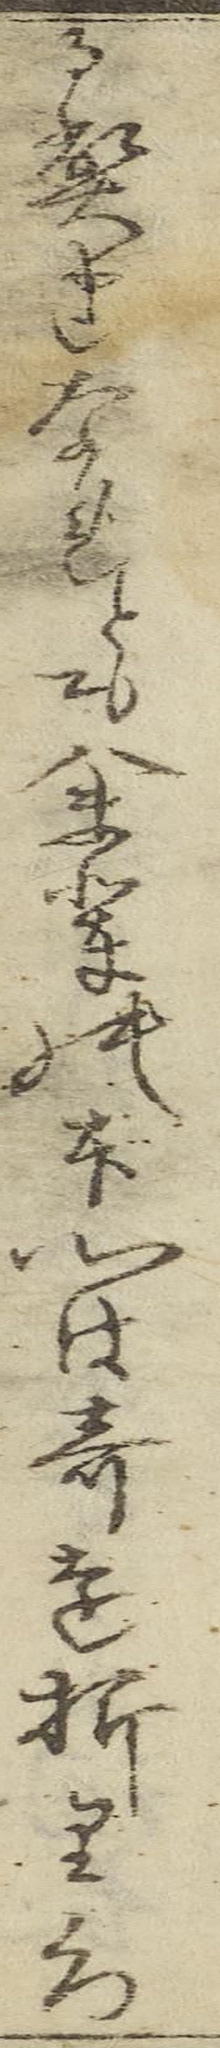るへきなれとも余輩の本心は奇を折り幻
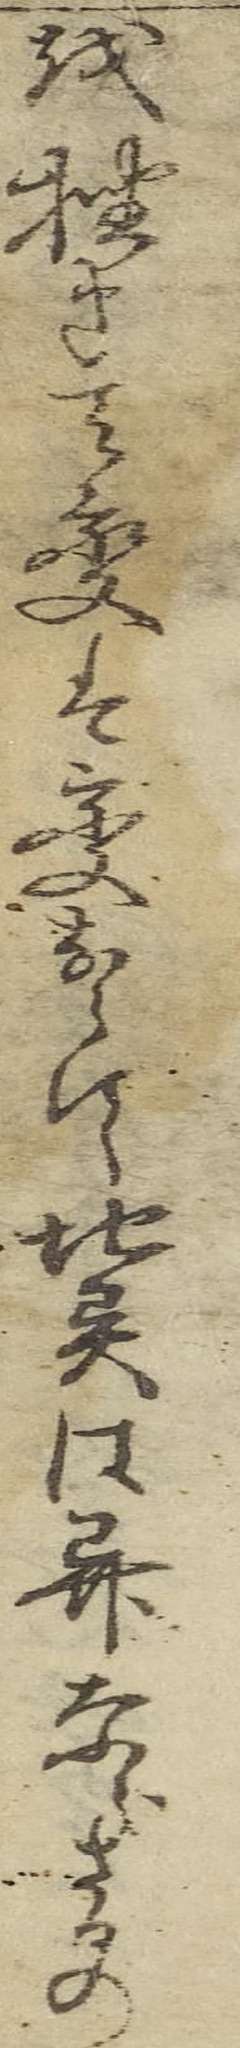を挫きて変は変ならす地異は異ならさるの

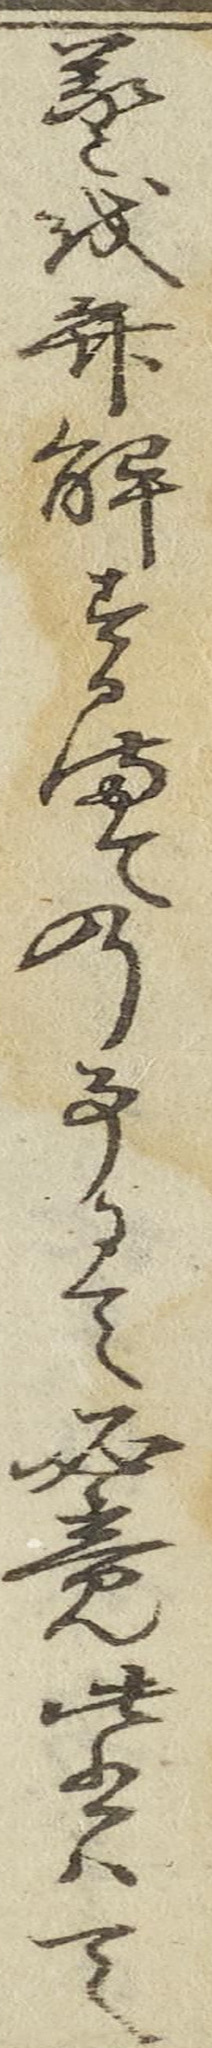義を弁解するまての事にて必竟此書は天
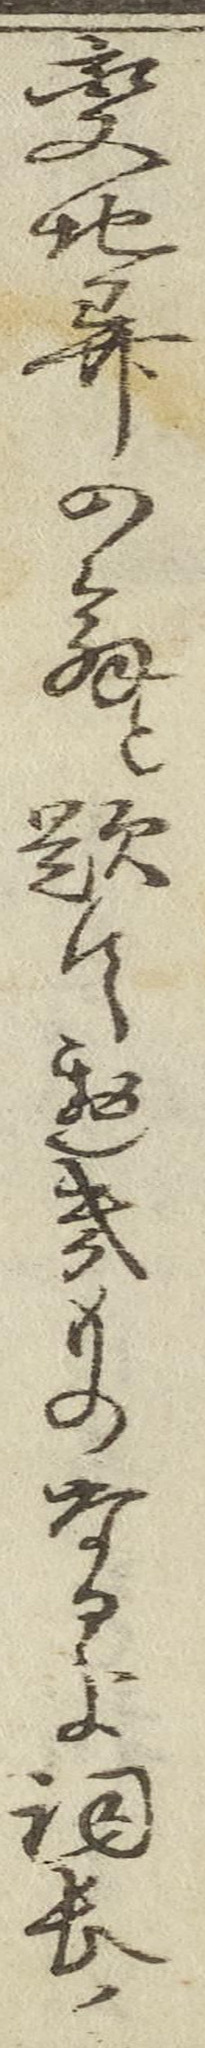変地異の解と題すへきものなるに詞長く
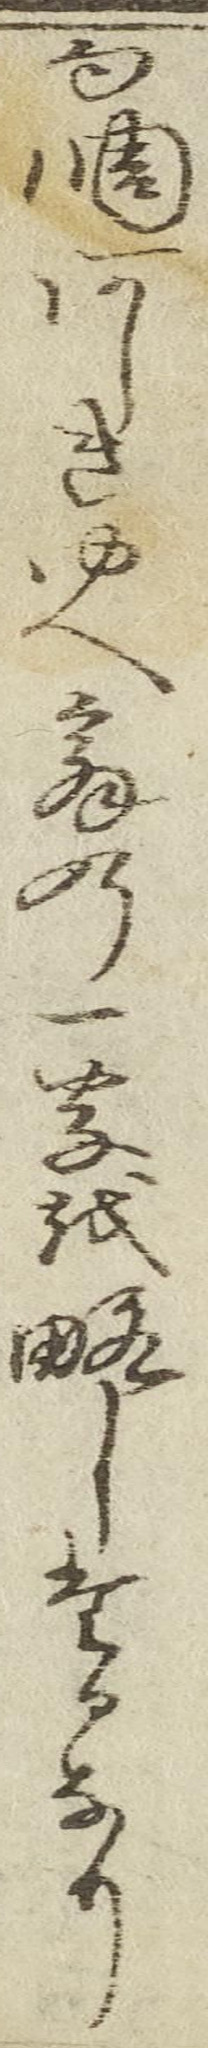句調あしきゆへ解の一字を略したるなり
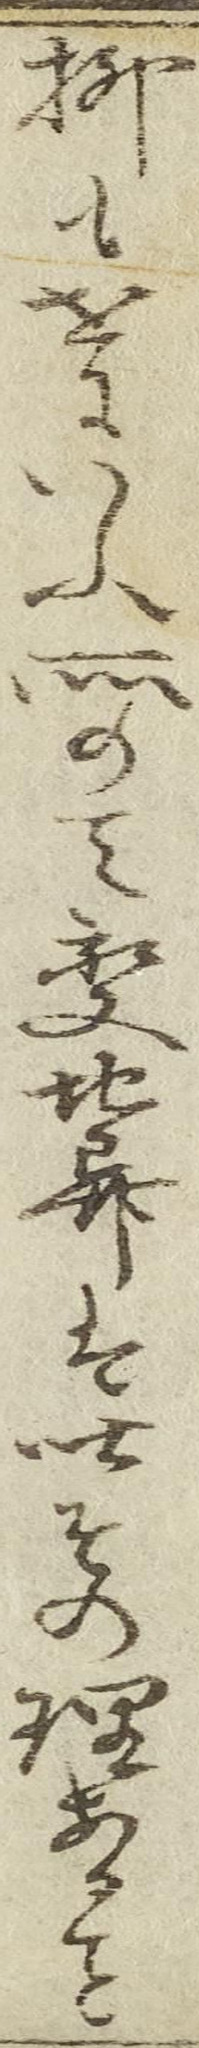抑も世にいふ所の天変地異は皆その理あること
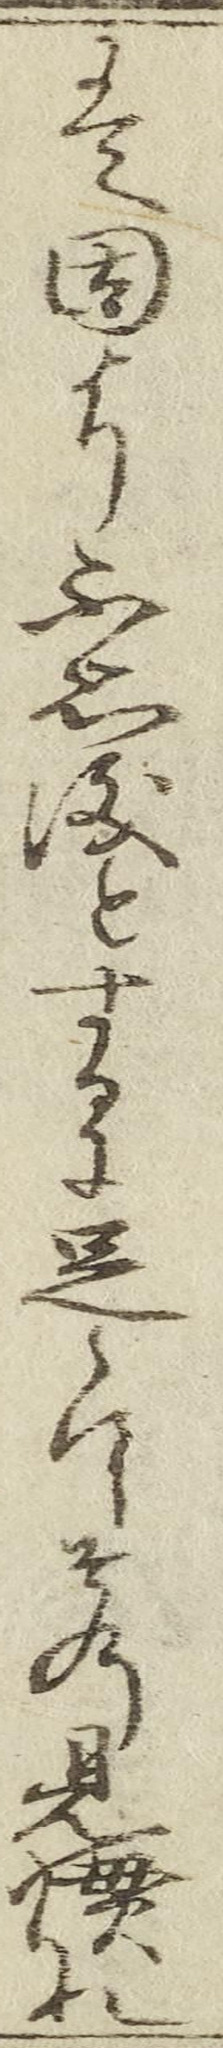にて固より不思儀とするに足らすその見慣れ
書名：天変地異
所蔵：東京大学地震研究所図書室 Earthquake Research Institute Library, The University of Tokyo, JAPAN
